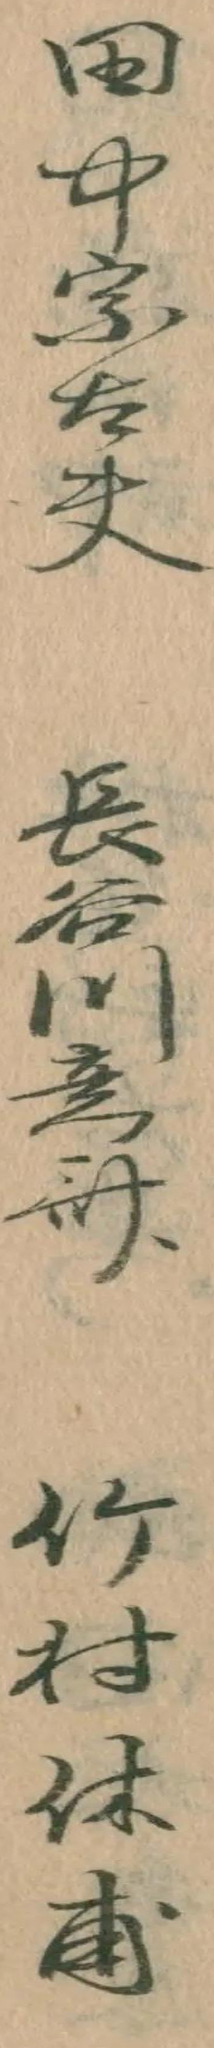田中宗太夫長谷川意斎竹村休甫
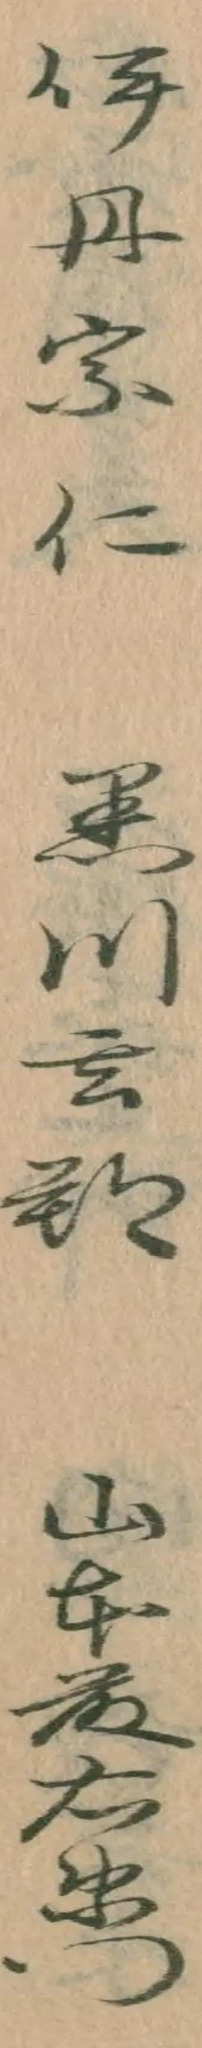伊丹宗仁黒川玄朔山本藤右衛門
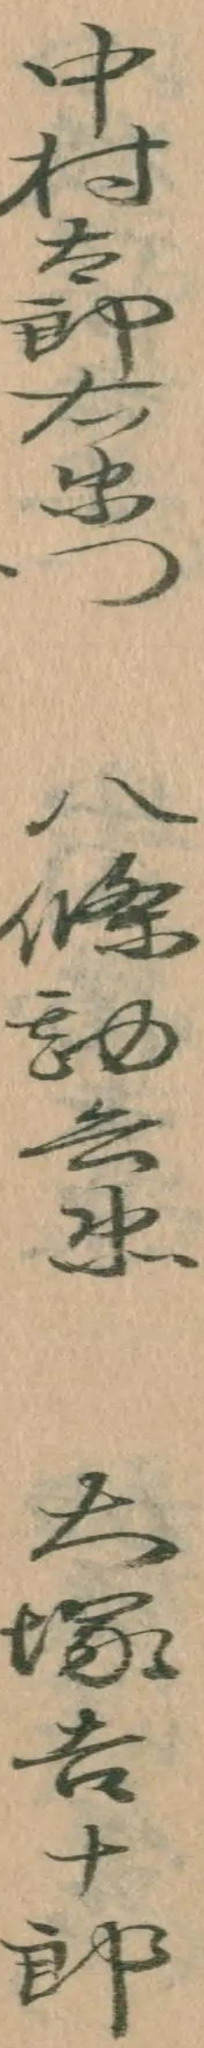中村太郎右衛門八条勘兵衛大塚吉十郎
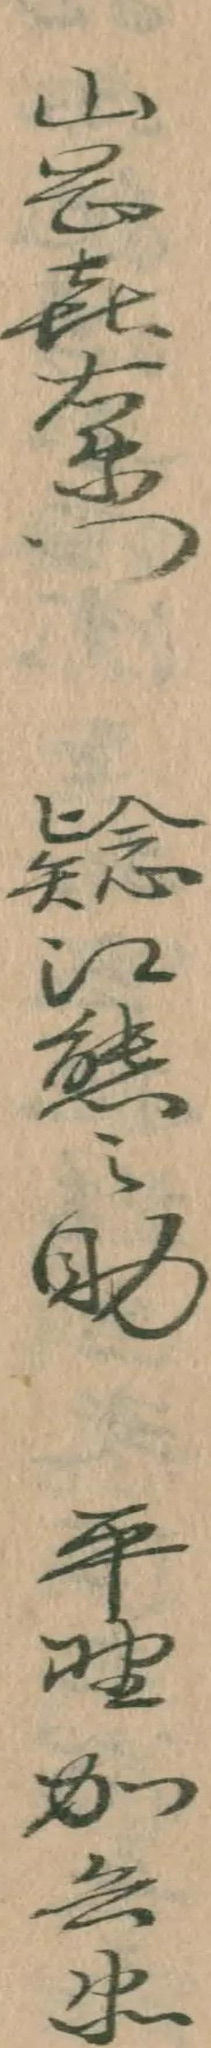山岡喜右衛門江熊之助平野加兵衛
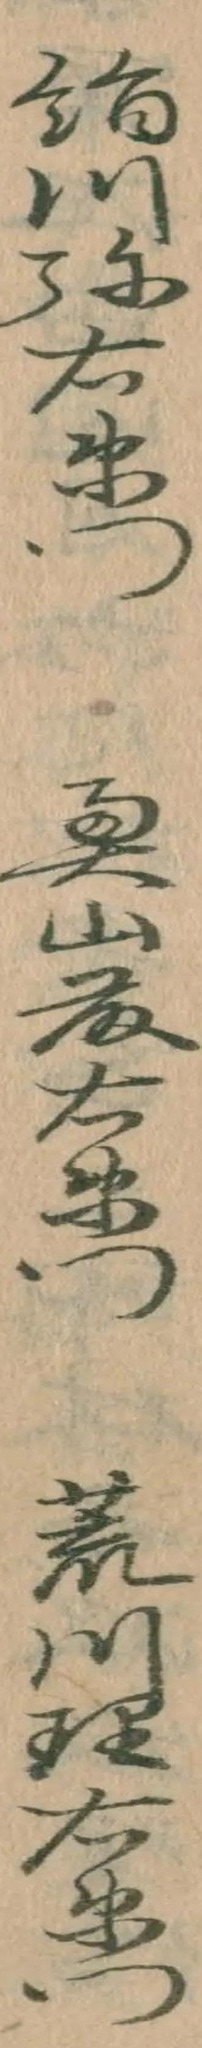絹川弥右衛門奥山藤右衛門荒川理右衛門
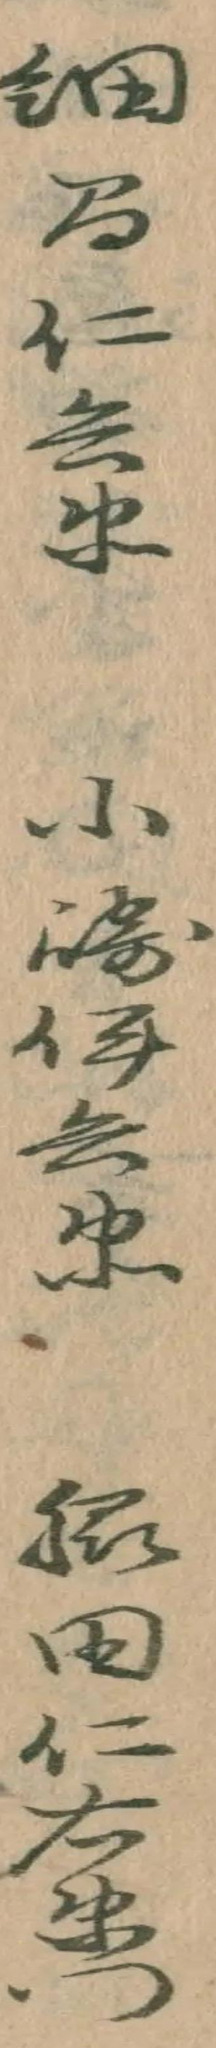細間仁兵衛小崎伊兵衛脇田仁右衛門
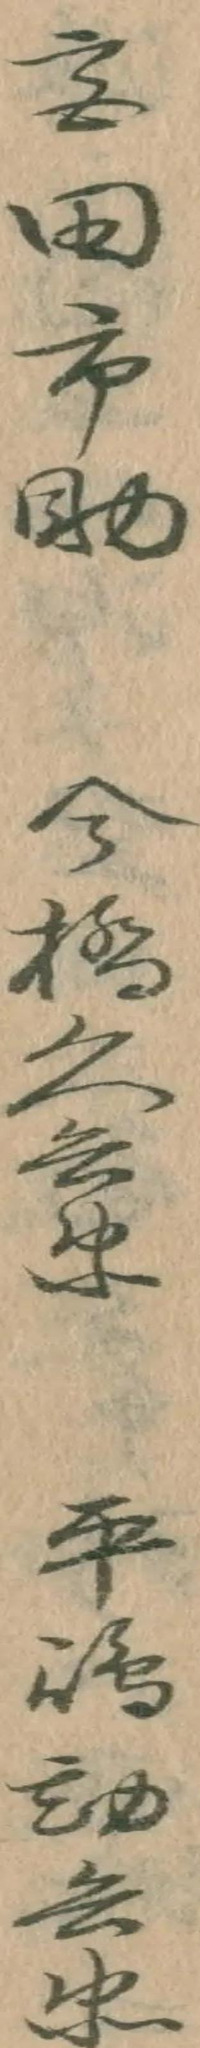宮田市助今橋久兵衛平島勘兵衛
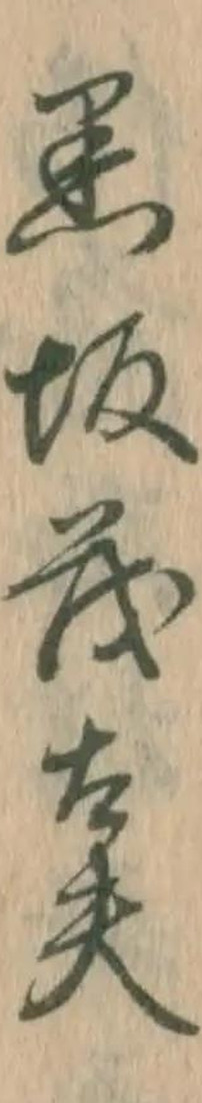黒坂茂太夫
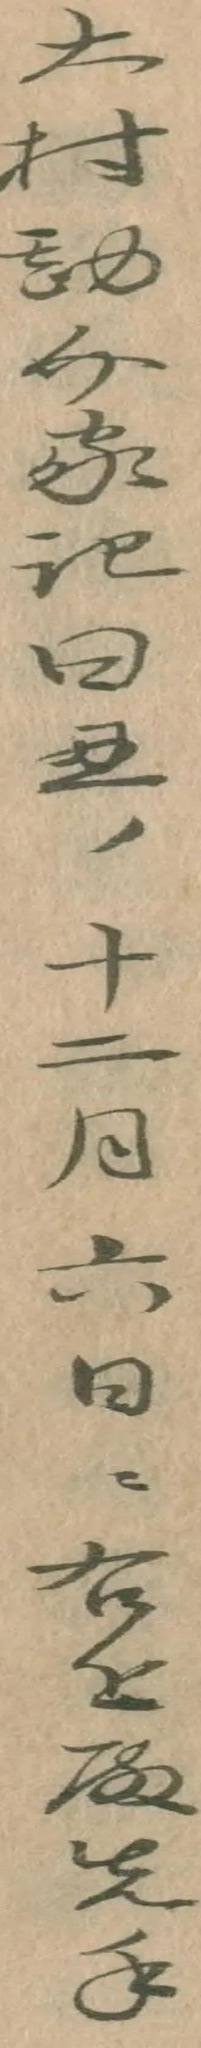大村勘介家記曰丑ノ十二月六日に右近殿先手
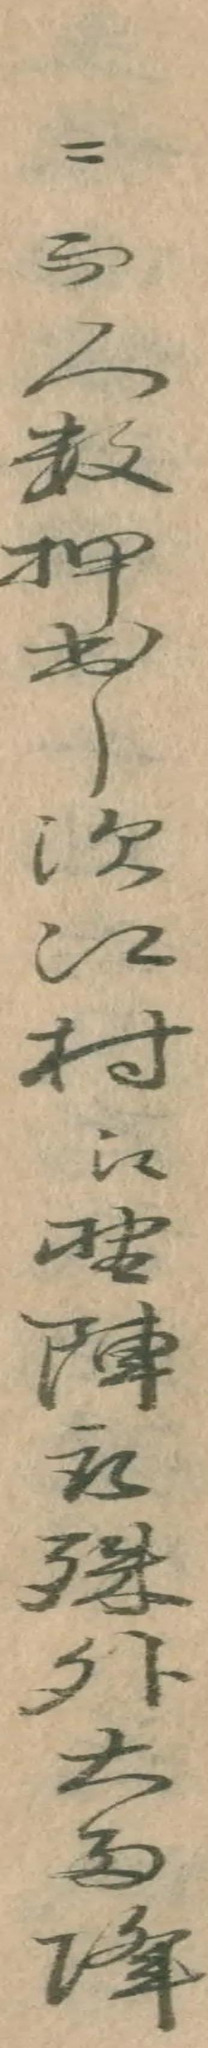に而人数押出し次江村江野陣取殊外大雨降
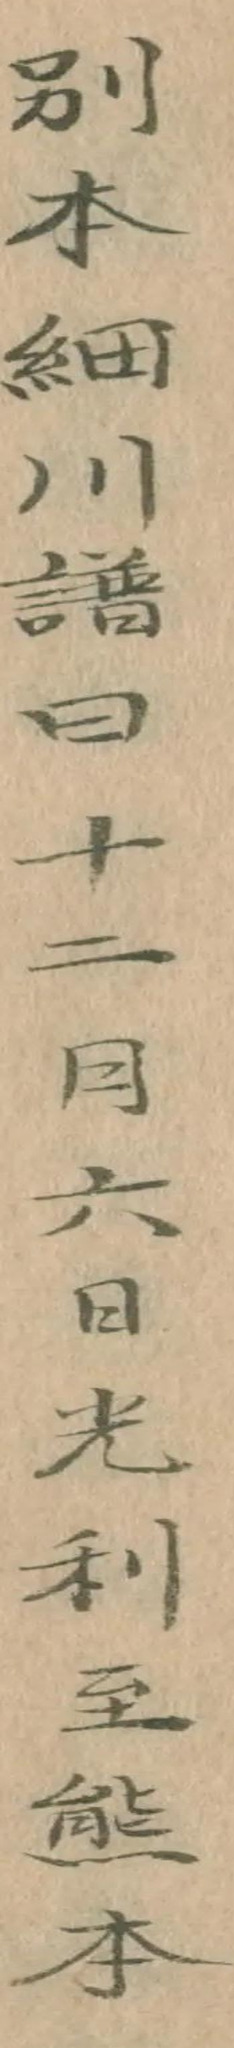別本細川譜曰十二月六日光利至熊本
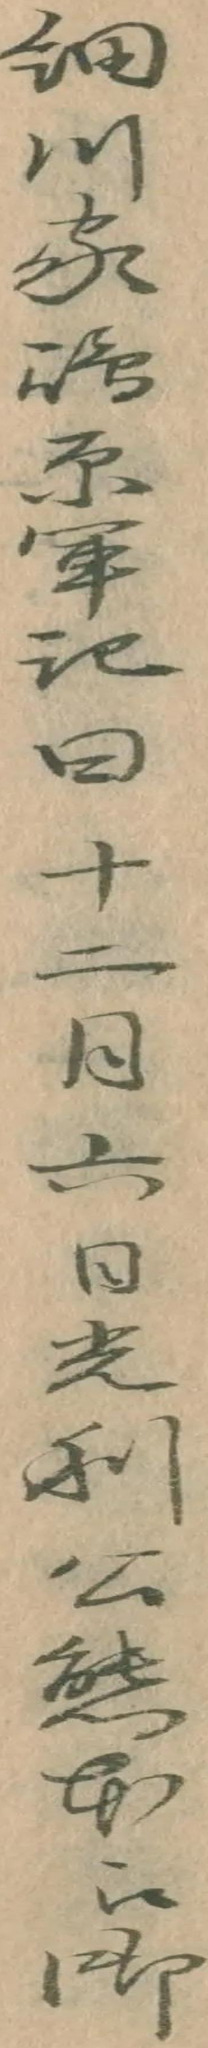細川家島原軍記曰十二月六日光利公熊本江御

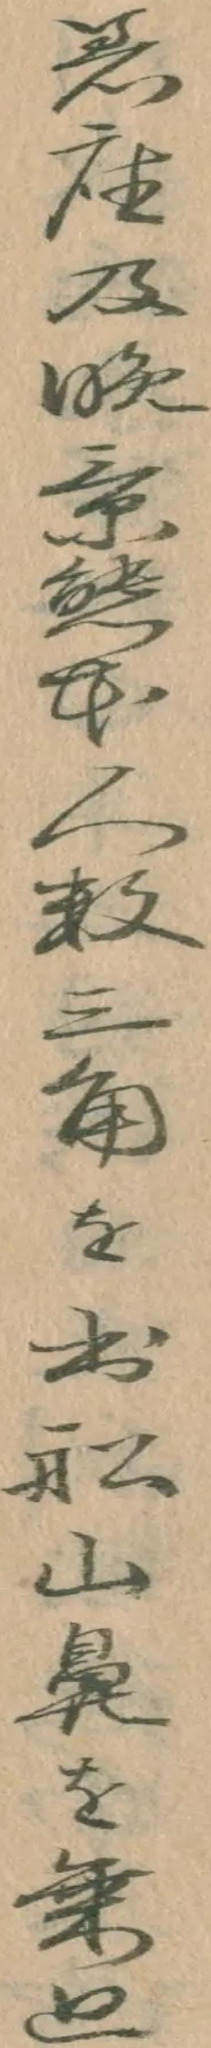着座及晩景熊本人数三角を出船山鼻を乗廻
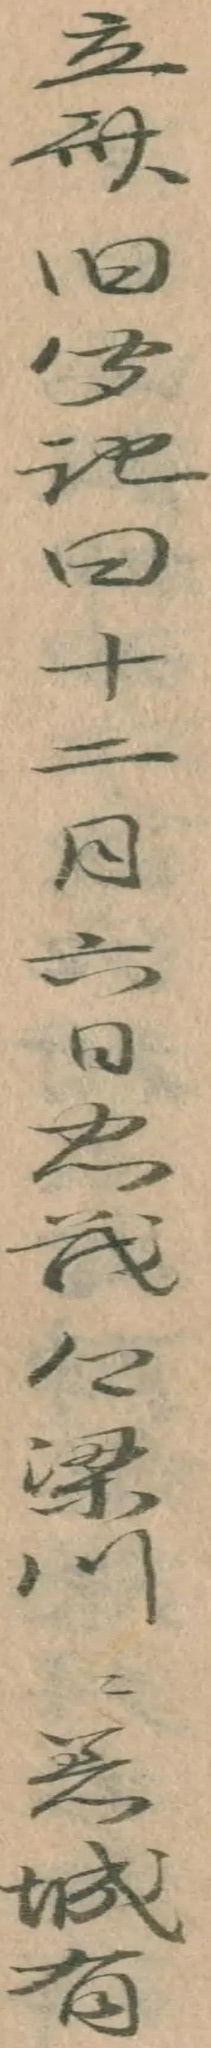立斎旧聞記曰十二月六日忠茂卿梁川に着城有
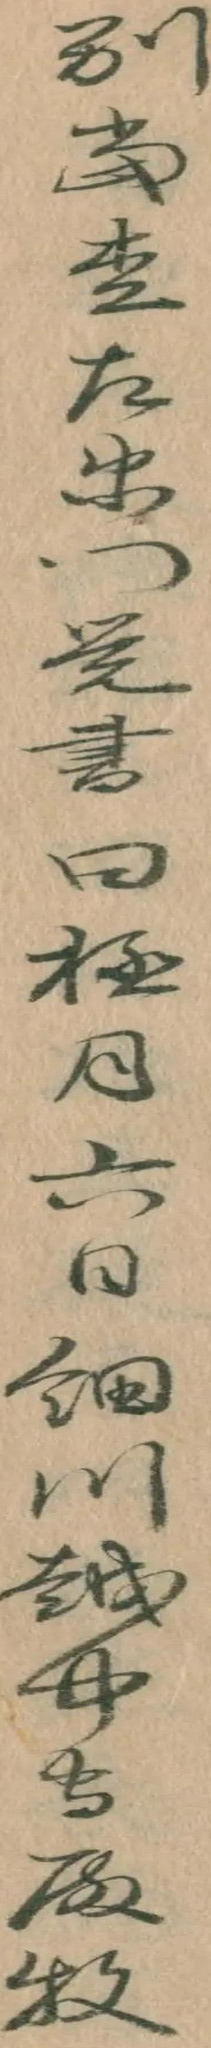別当杢左衛門覚書曰極月六日細川越中守殿牧
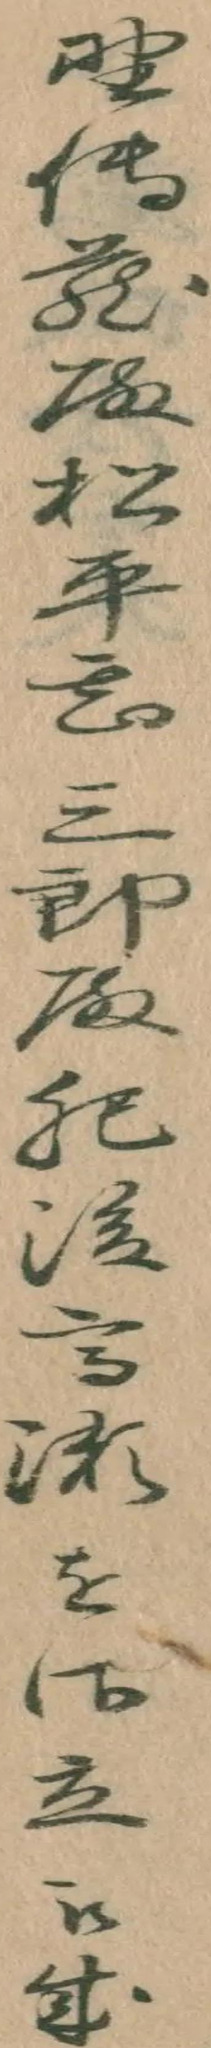野伝蔵殿松平甚三郎殿肥後高瀬を御立候成
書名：切支丹御退治記 49巻. [3]
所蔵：国立国会図書館 National Diet Library, JAPAN
